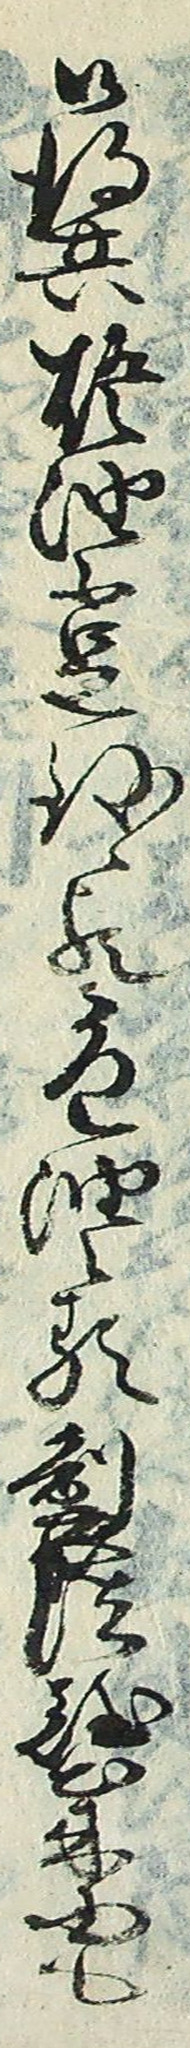候得共燈油不足致候歟色油之類製法難出来国も
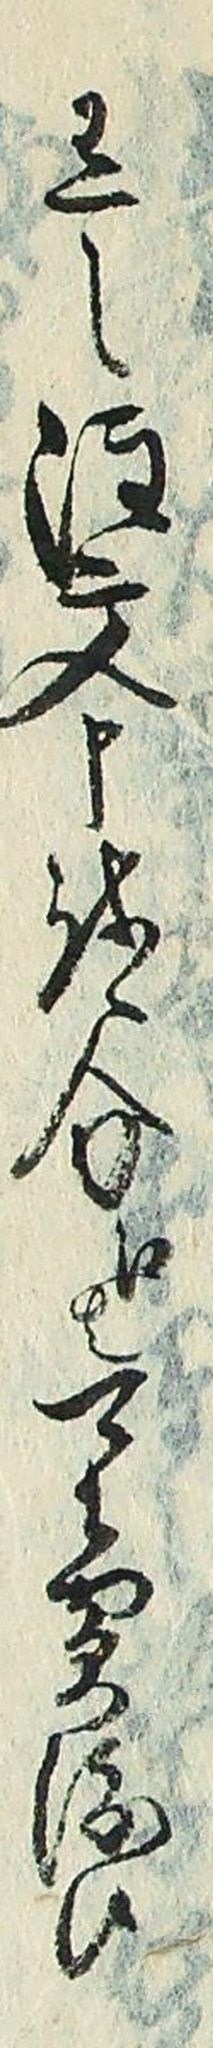有之注文申致候分江者賣渡候
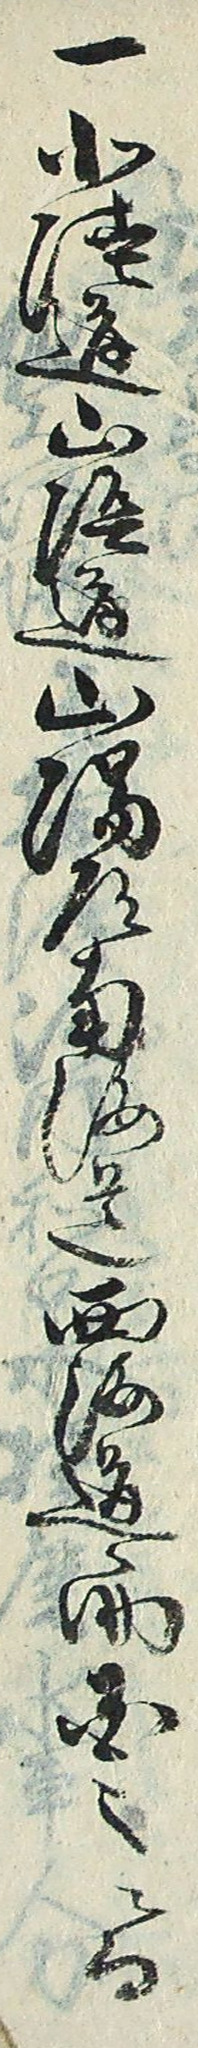一北陸道山陰道山陽道南海道西海道筋国々に而

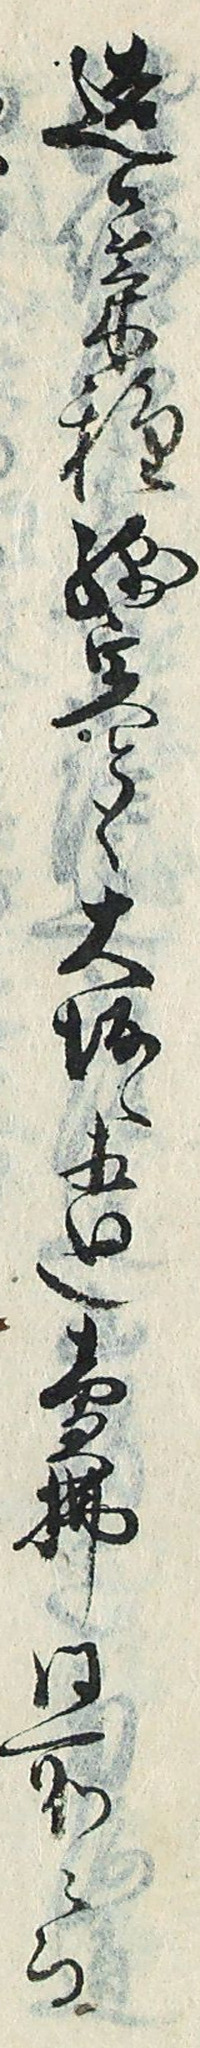造候菜種綿実とも大坂へ相廻し賣拂同所に而
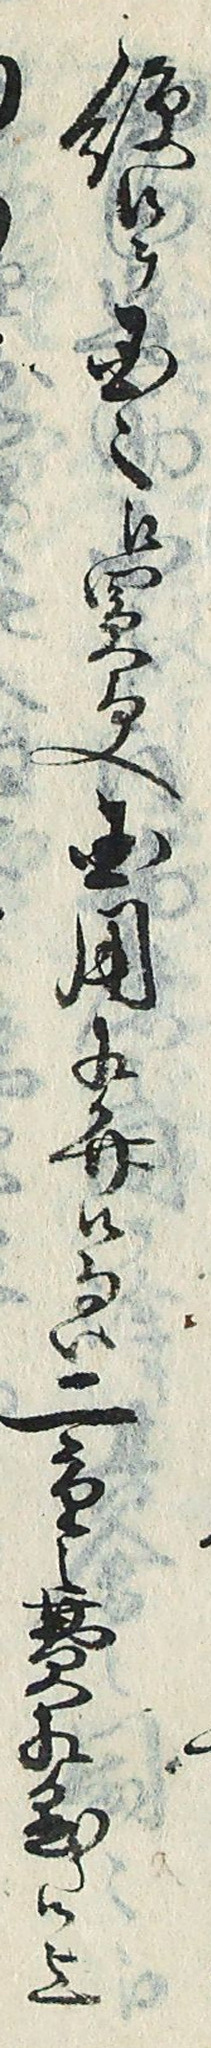絞候を国々江買受国用相弁候而は二重之費相懸り候上
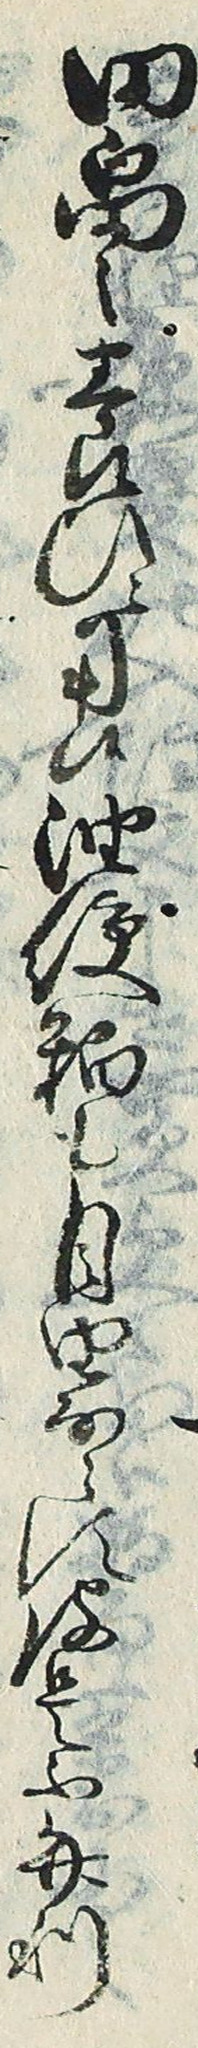田畠之養ひに用候油絞粕も自由ならす彼是不弁利
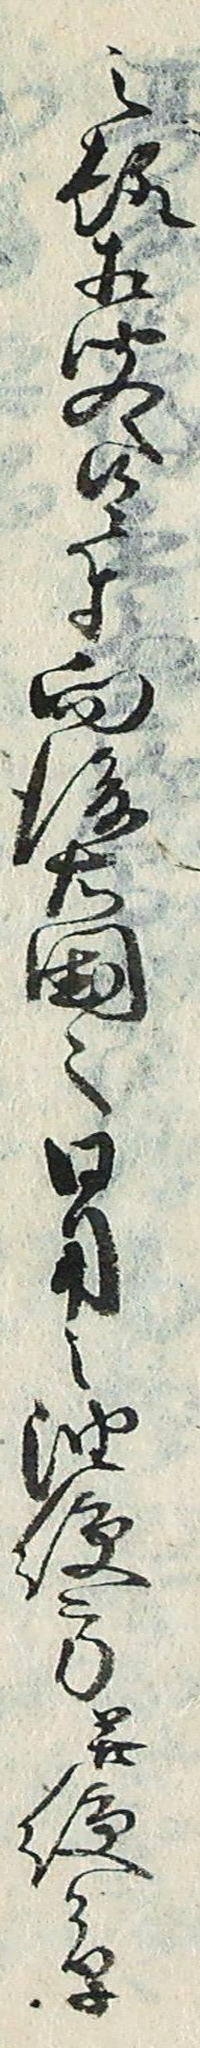之趣相聞へ候に付向後右国々日用之油絞方幷絞草
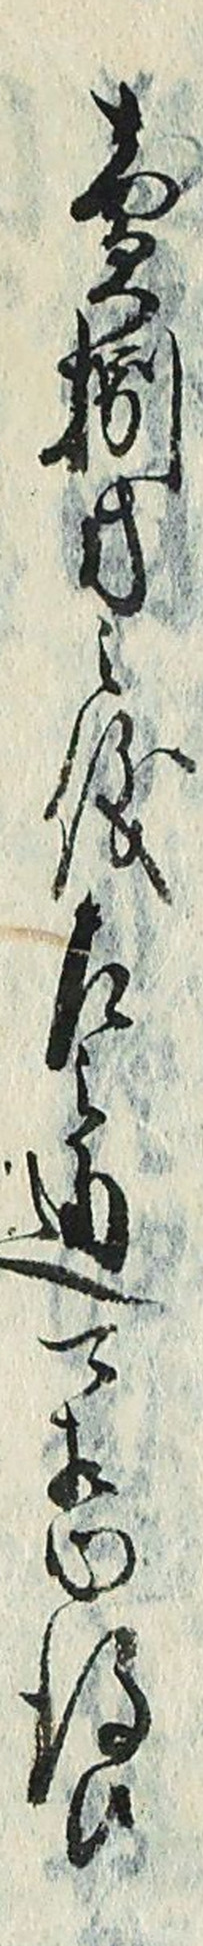賣捌方之儀左之通可相心得候
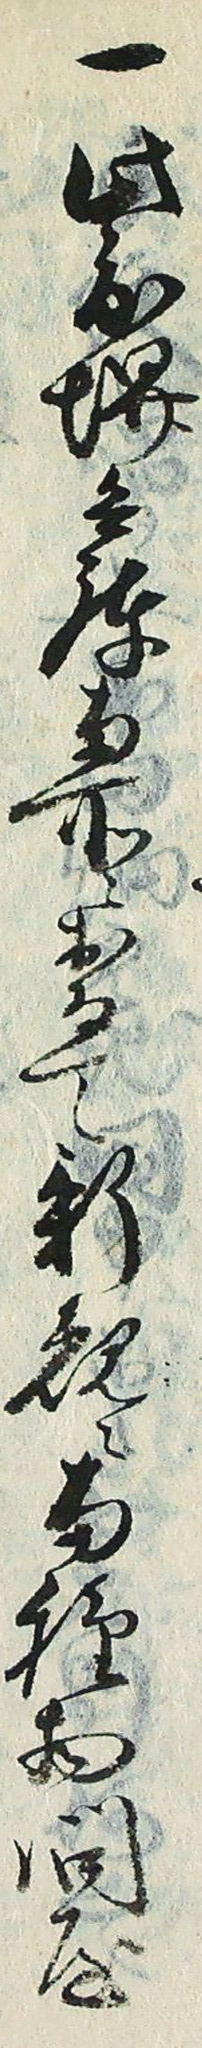一此度堺兵庫両所におゐて新規に両種物問屋
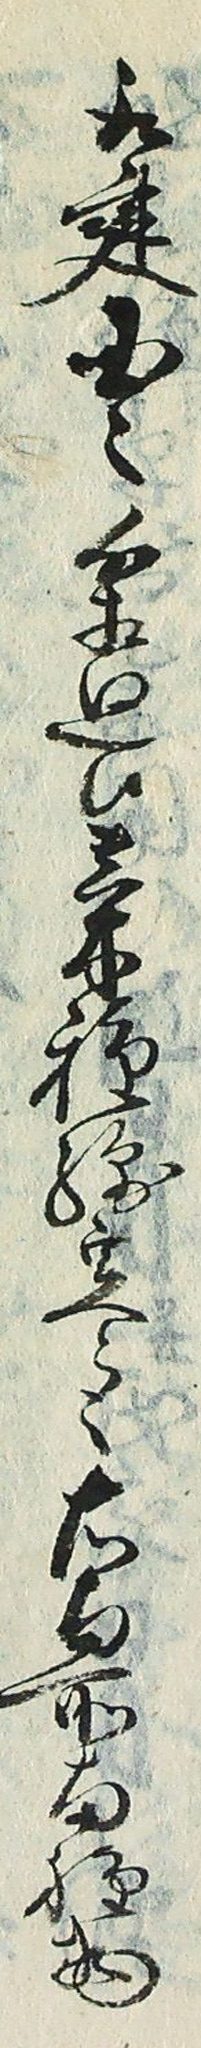取建国々ゟ相廻候菜種綿実とも右両所両種物
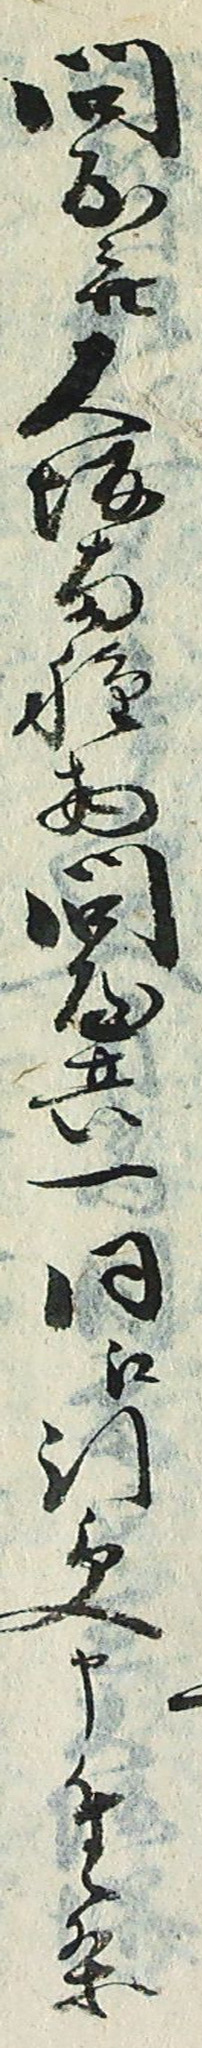問屋幷大坂両種物問屋共一同江引受申付候条
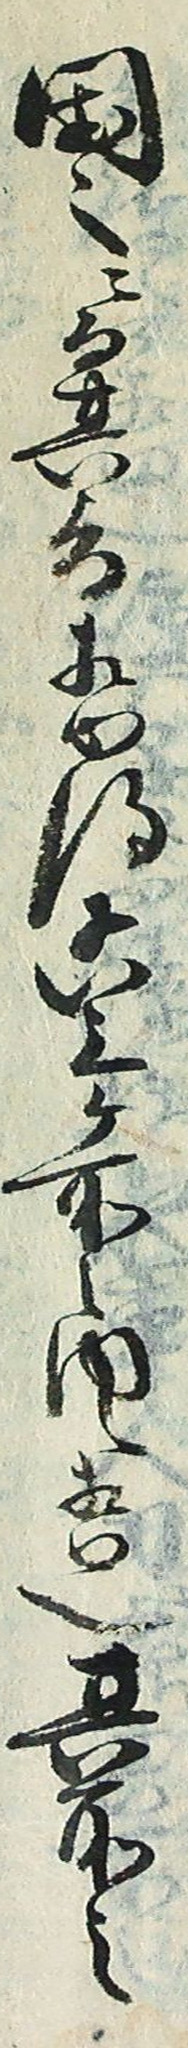国々に而其旨相心得右三ケ所之内へ相廻其所之
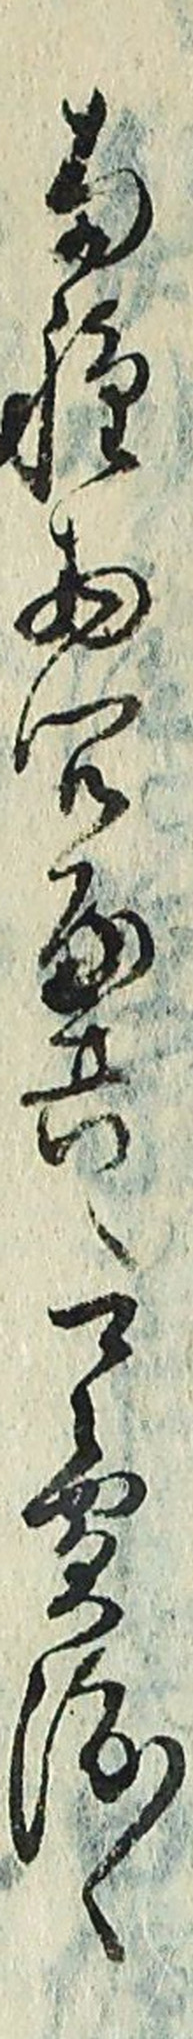両種物問屋共へ可賣渡候
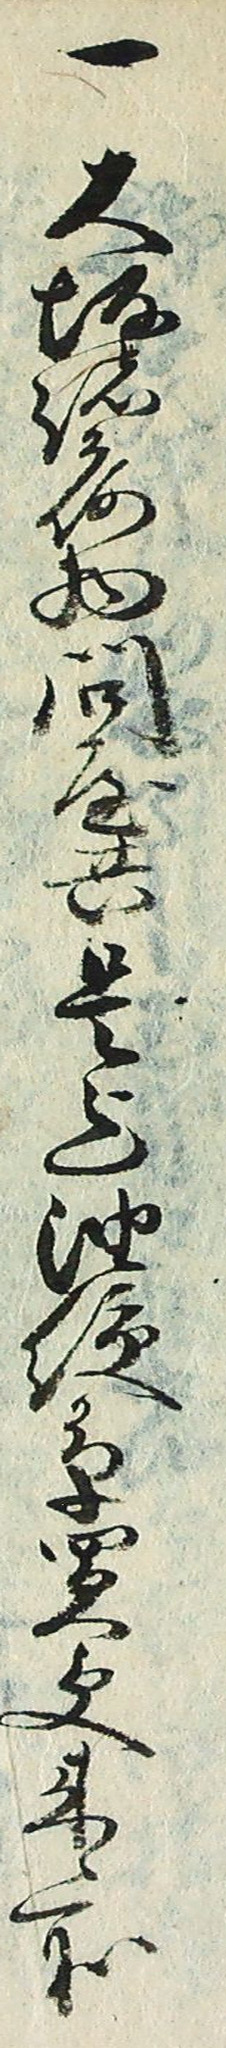一大坂諸荷物問屋共是迄油絞草買受来候所
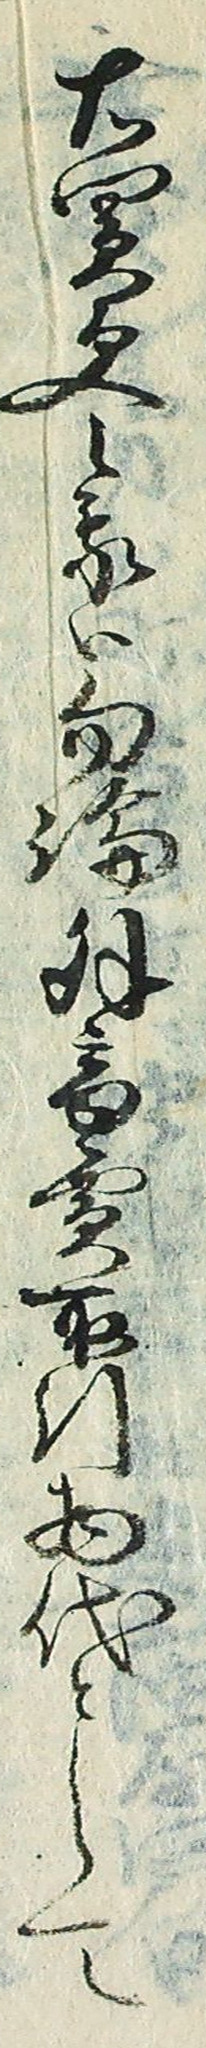右買受之義は勿論外商売取引物代として
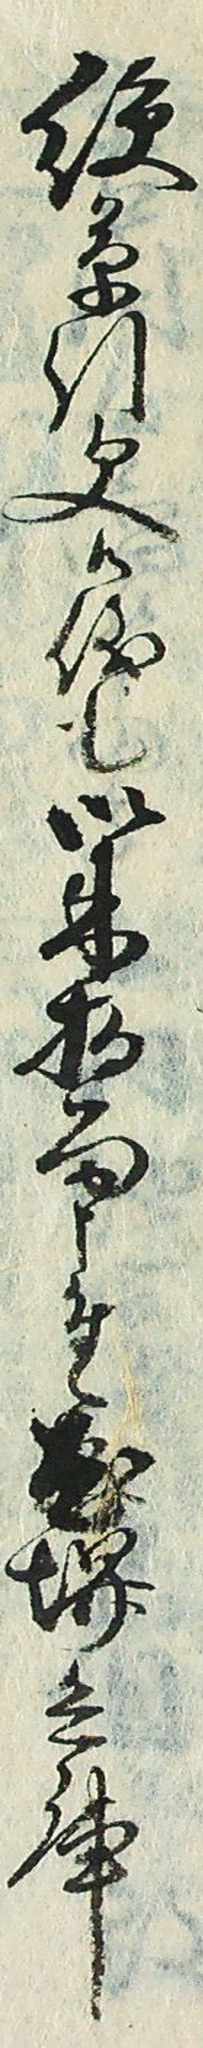絞草引受候儀も以来指留申付候尤堺兵庫
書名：油稼御取究ニ附御箇條書テ以被仰渡南北同役申談御答書控
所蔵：鳴門教育大学 Naruto University of Education
